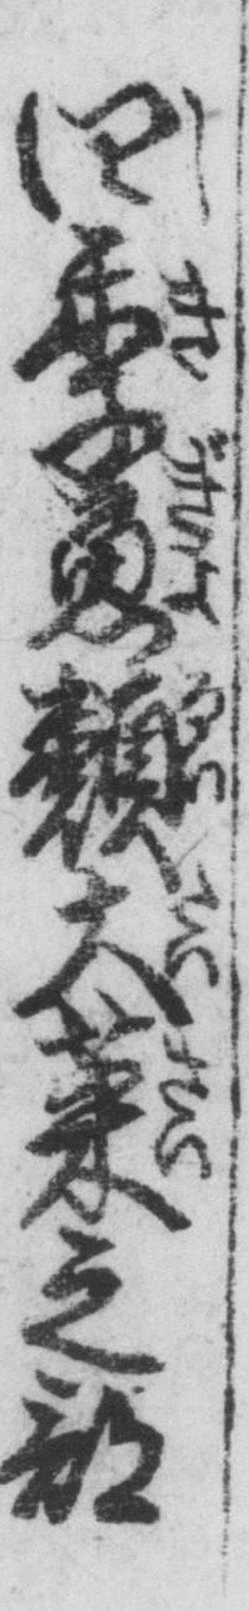四季魚類大菜之部
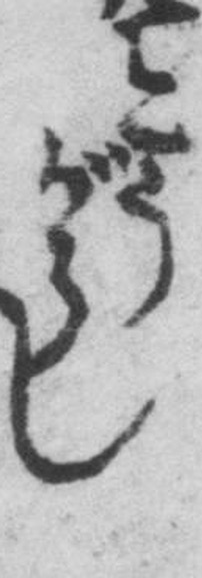がらし

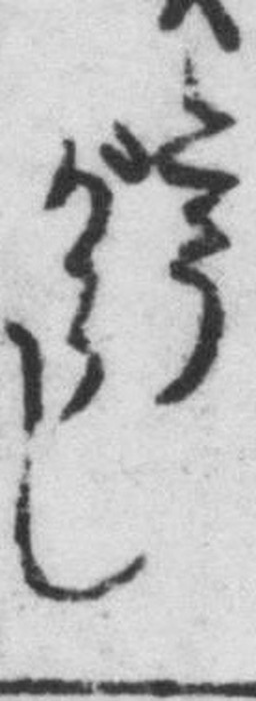がらし
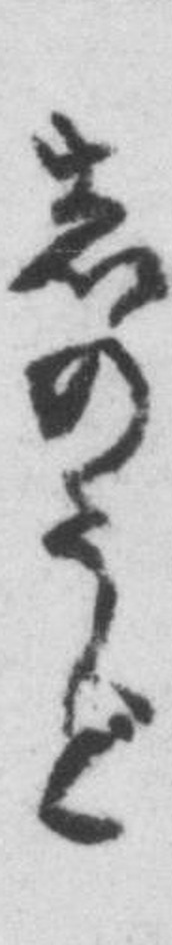しのうど
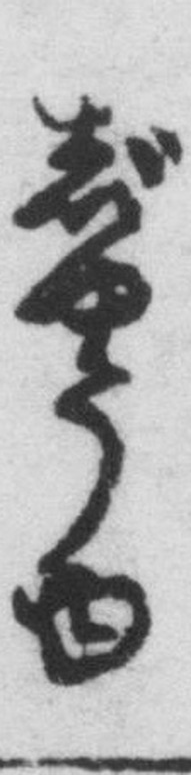じやうゆ
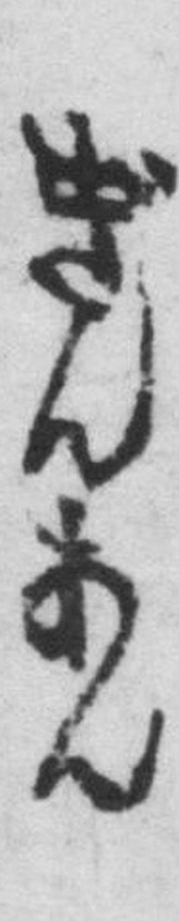ぎんあん
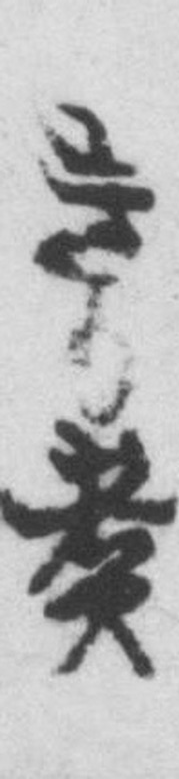きも煮
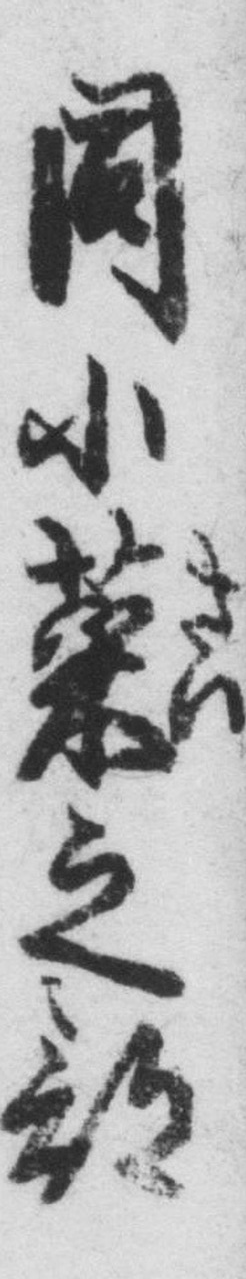同小菜之部
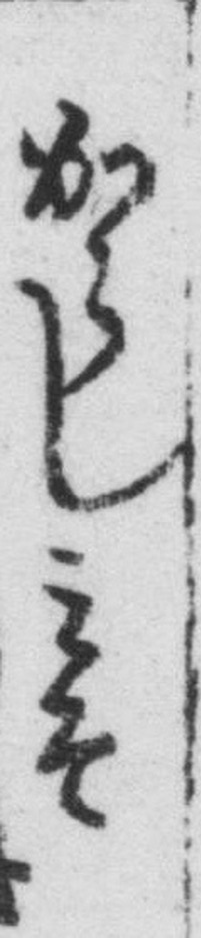からしせん
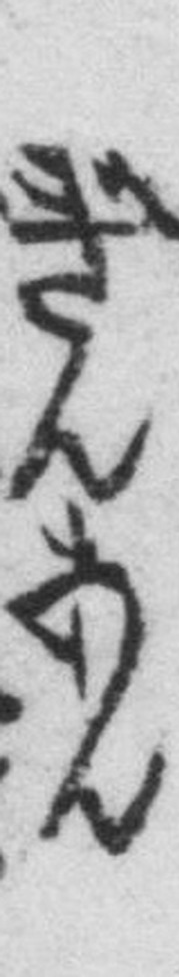ぎんあん
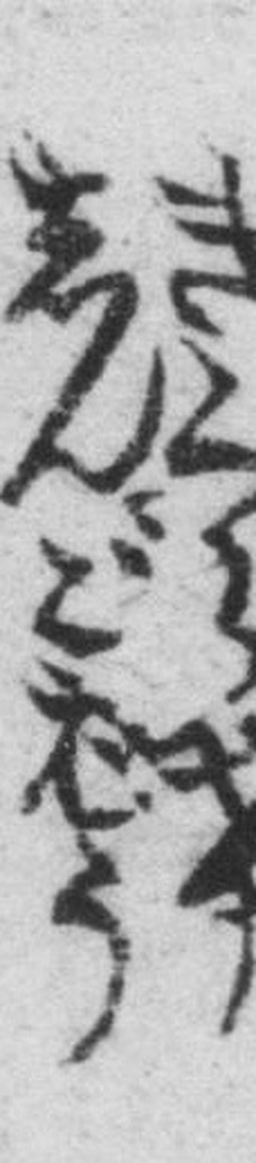しんごぼう
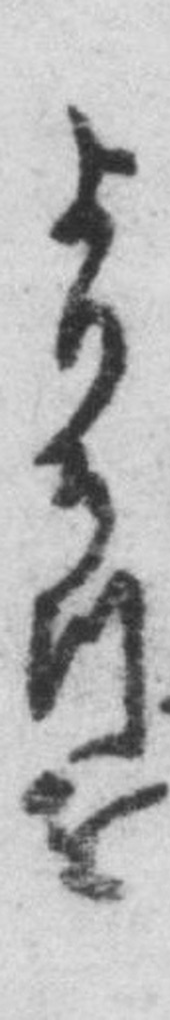よりかつを
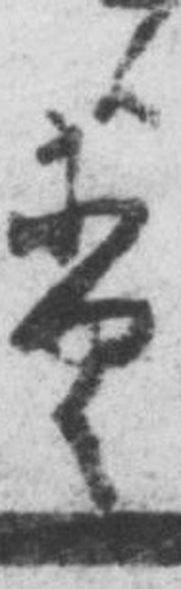にやく
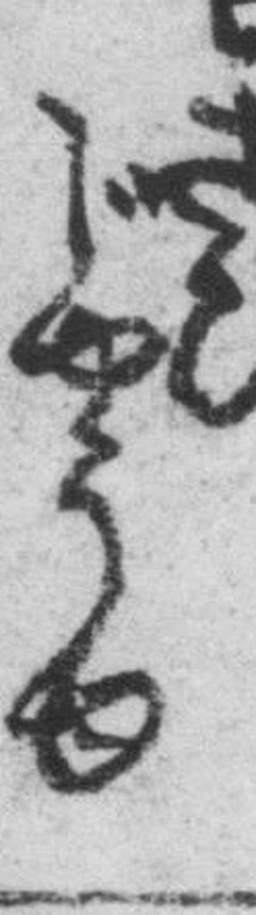じやうゆ
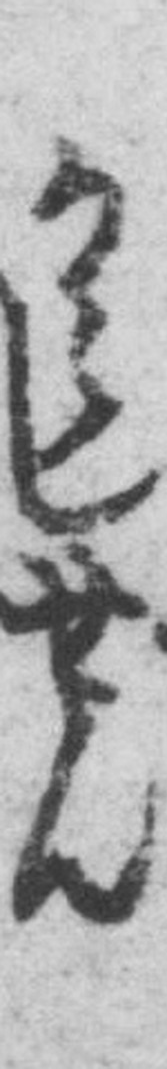からしせん

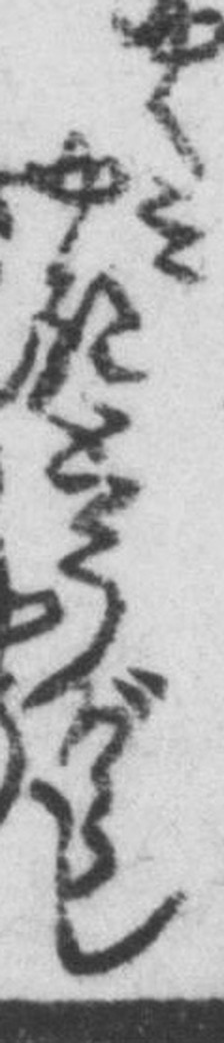やきとうがらし
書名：即席庖丁
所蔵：大阪府立大学学術情報センター 国文学研究資料館
